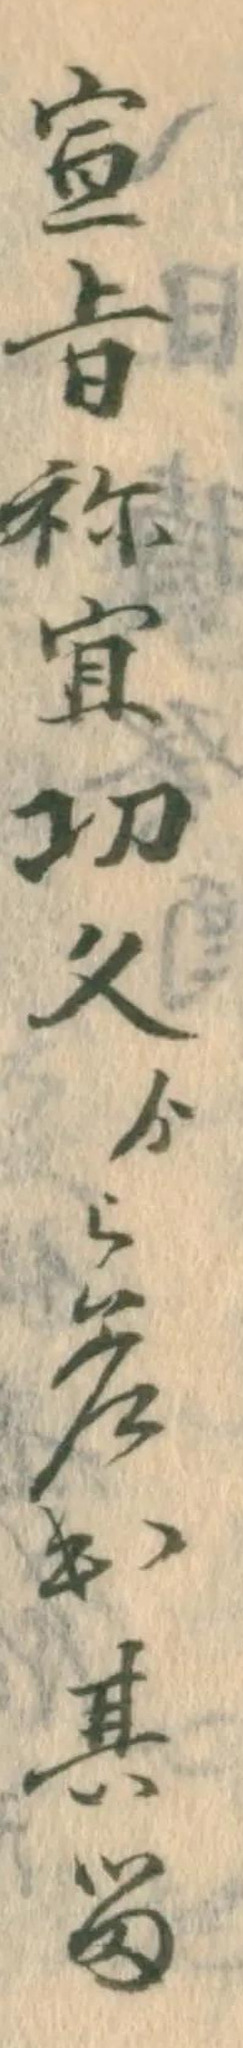宣旨祢宜功久ゟ被差出其留
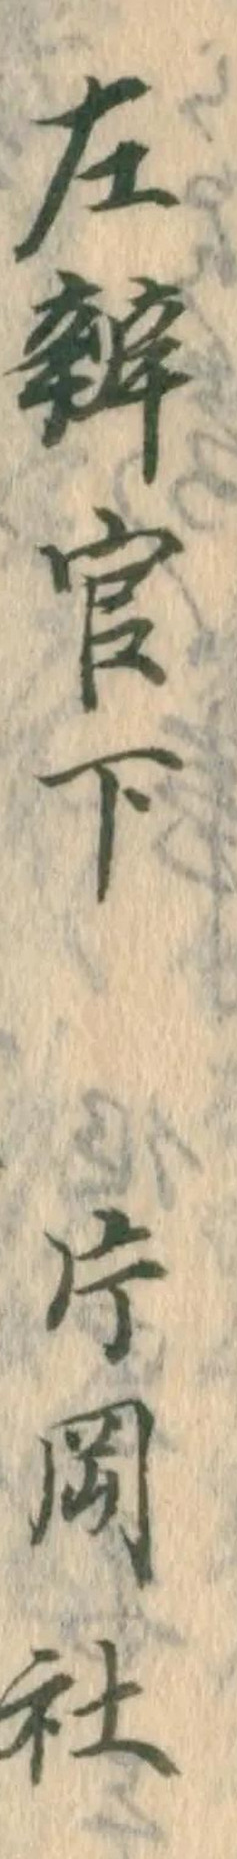左弁官下片岡社
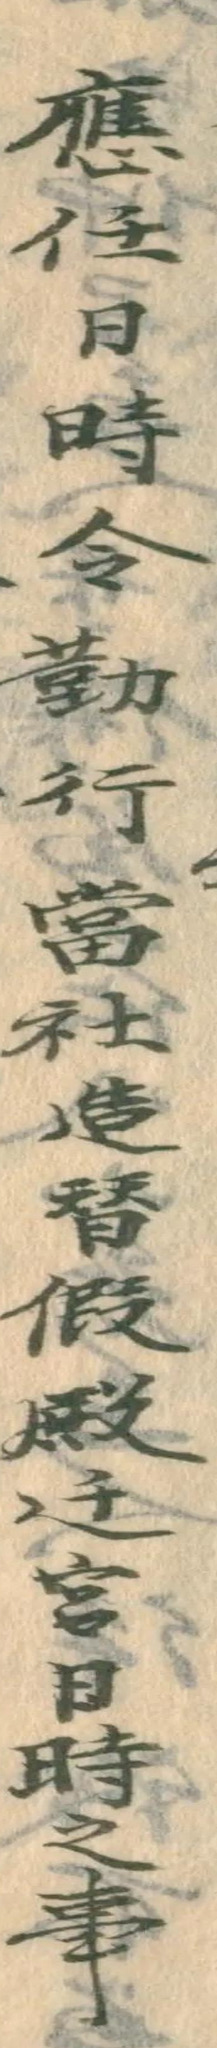応任日時令勤行当社造替仮殿迁宮日時之事
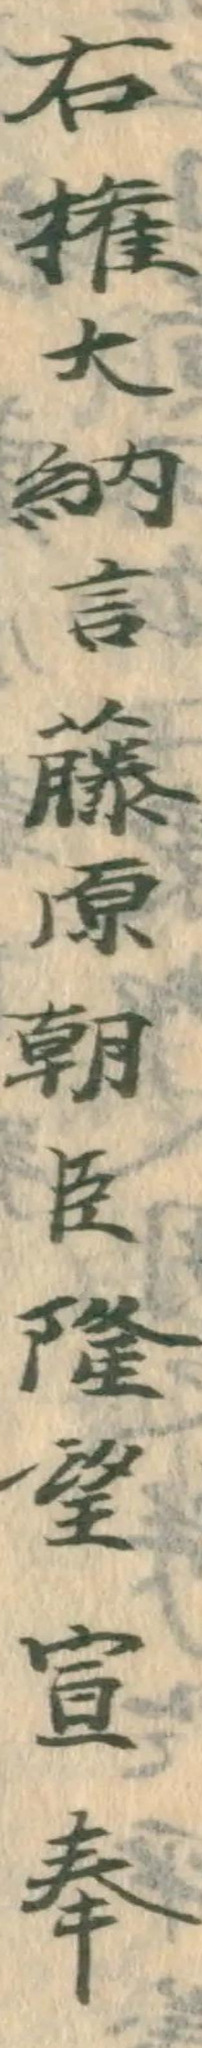右権大納言藤原朝臣隆望宣奉
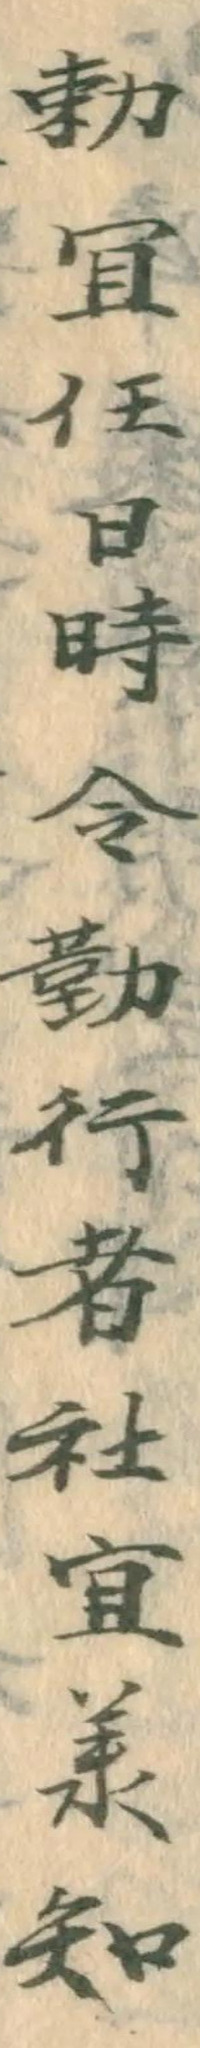勅宜任日時令勤行は社宜承知
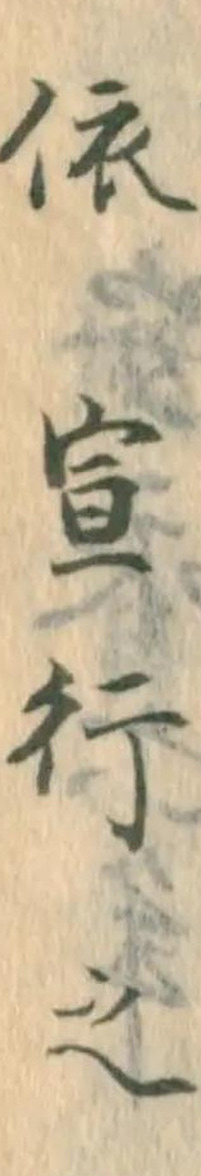依宣行之

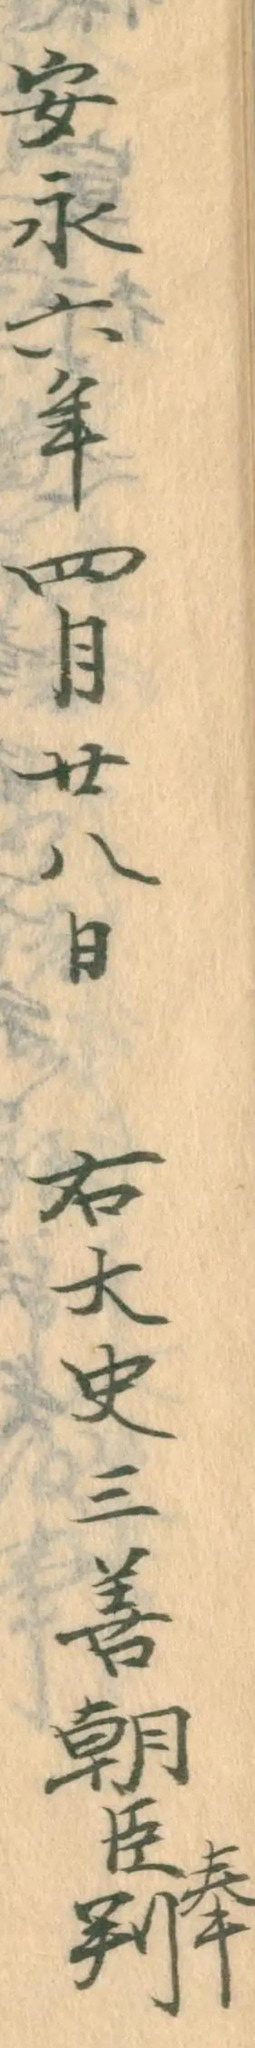安永六年四月廿八日右大史三善朝臣判
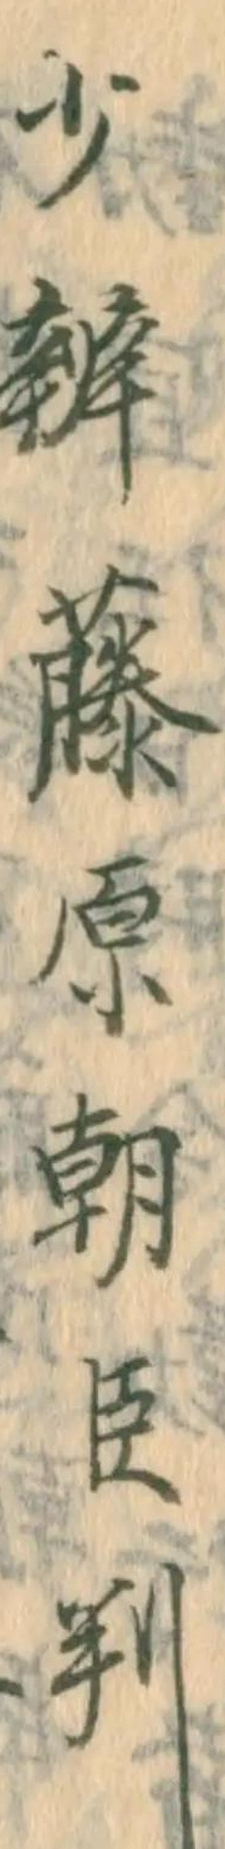少弁藤原朝臣判
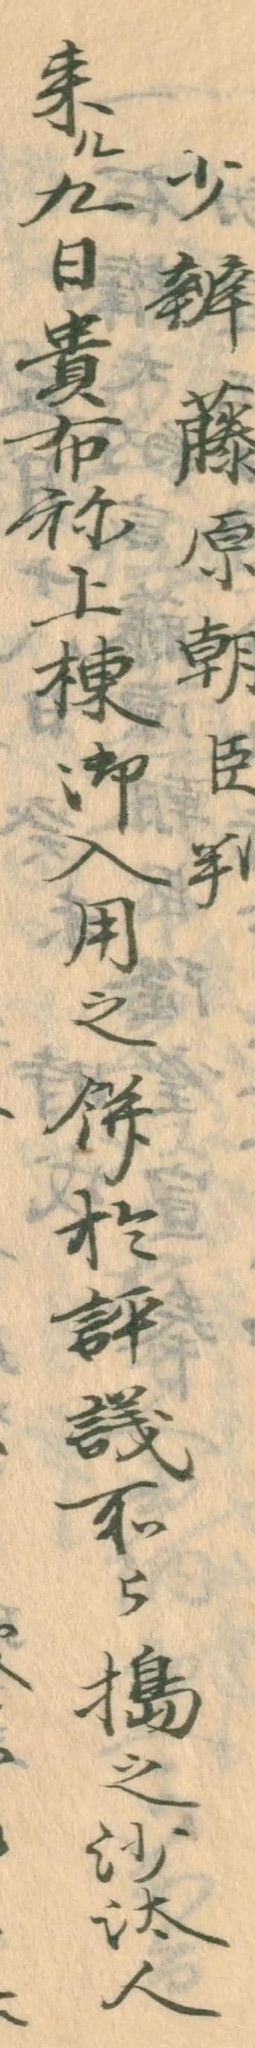一来ル九日貴布祢上棟御入用之餅於評議所被搗之沙汰人
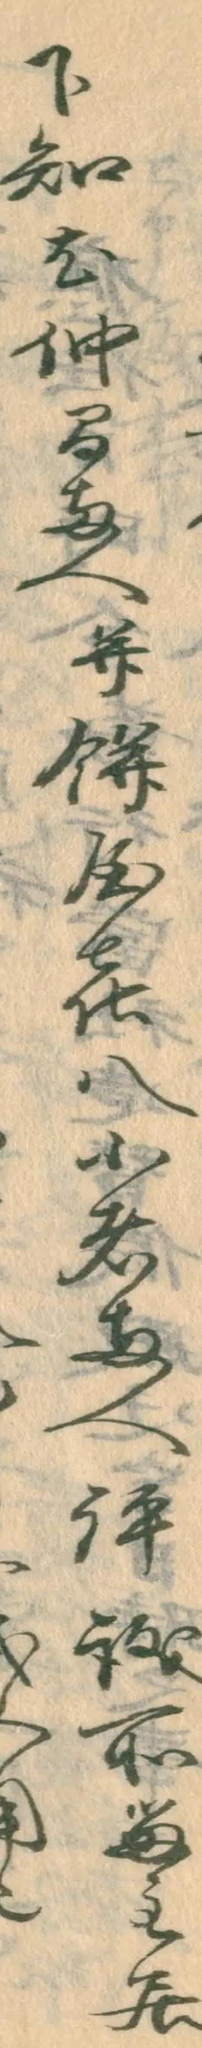下知尤仲間両人并餅屋喜八小者両人評議所留主居
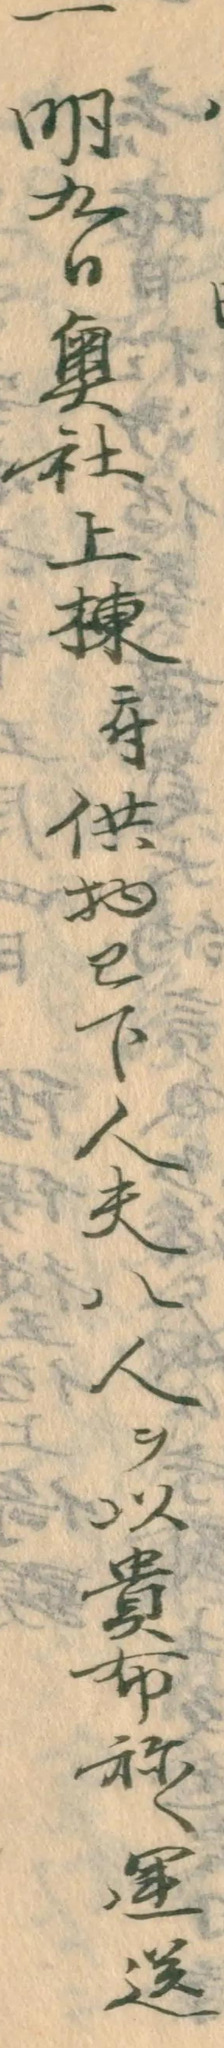一明九日奥社上棟ニ付供物已下人夫八人ヲ以貴布祢へ運送
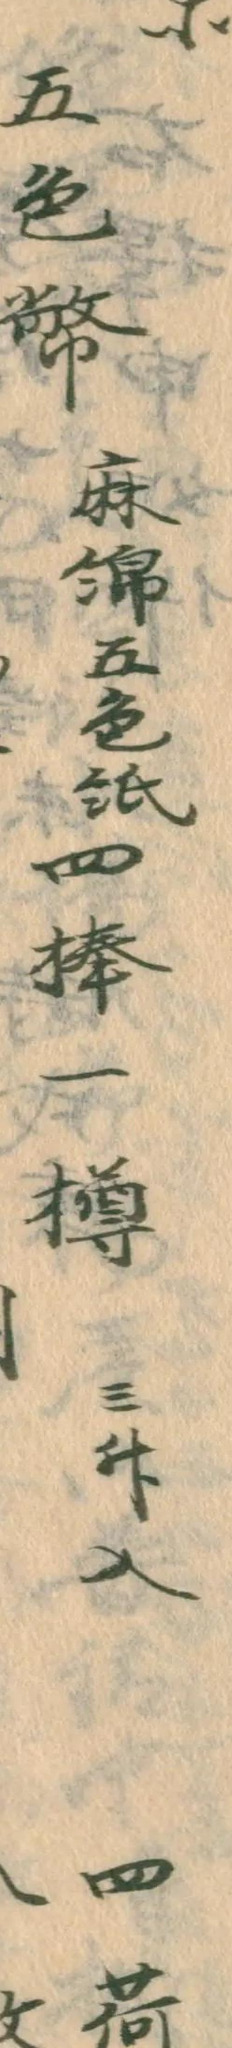一五色幣麻綿五色紙四捧一樽三升入四荷
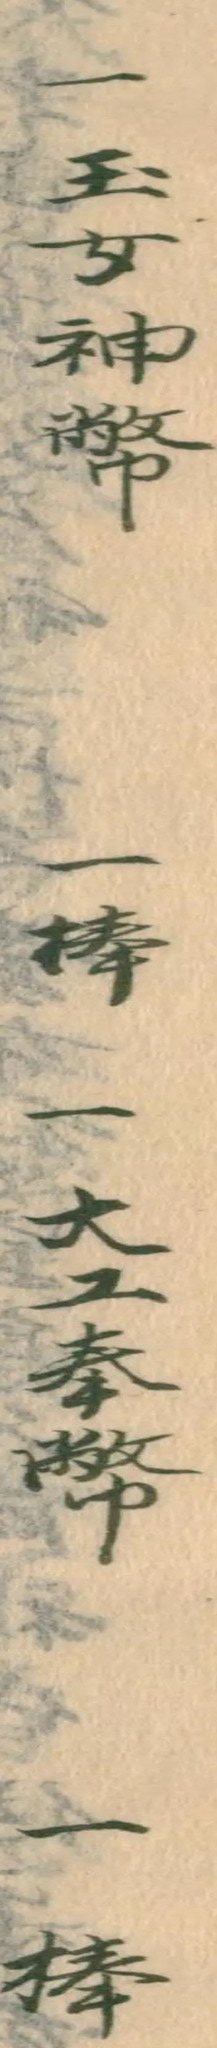一玉女神幣一捧一大工奉幣一捧
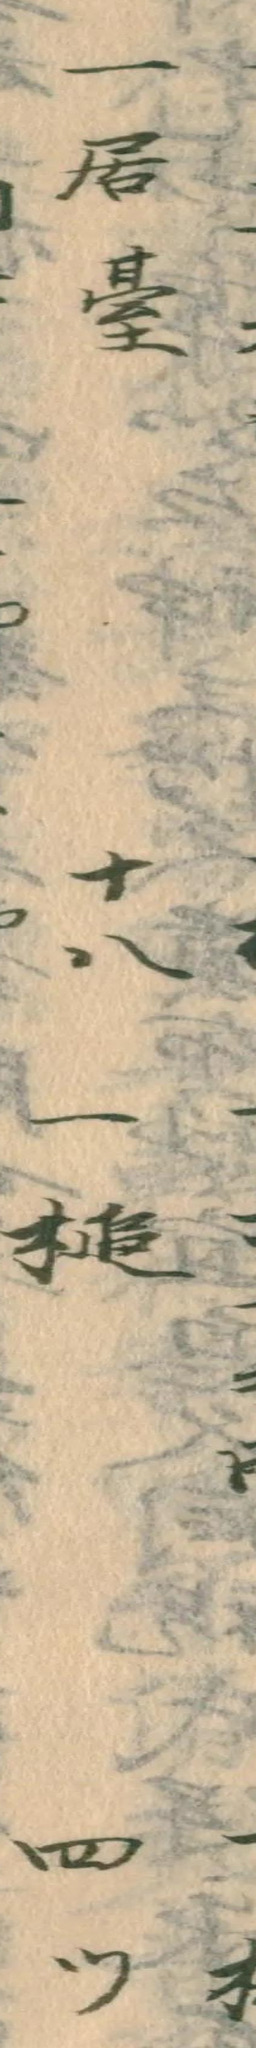一居台十八一槌四ツ
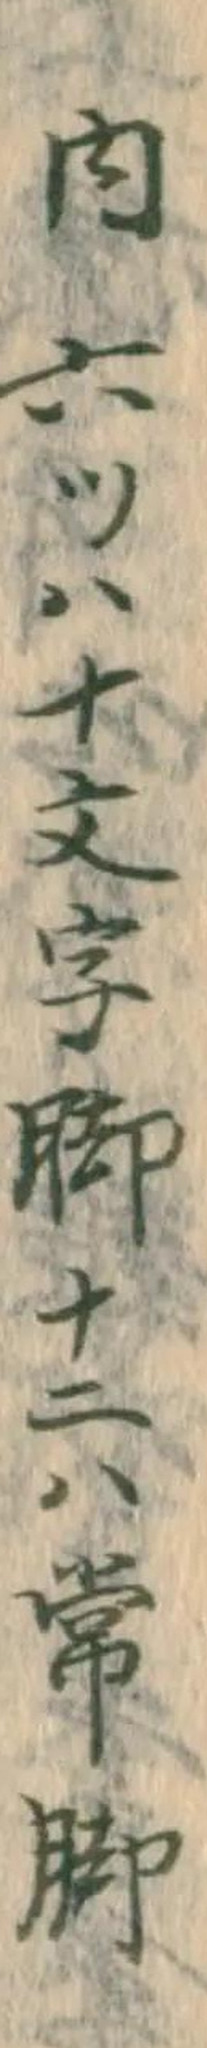内六ツハ十文字脚十二ハ常脚
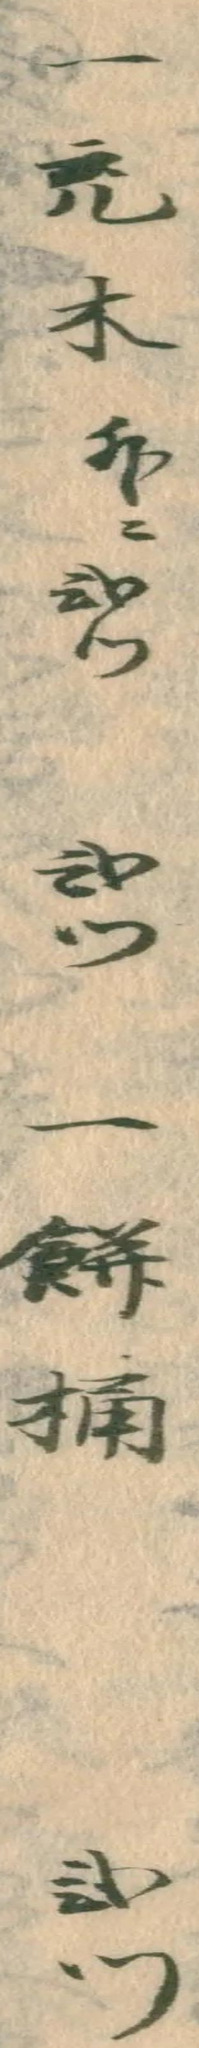一充木外ニ弐ツ弐ツ一餅桶弐ツ
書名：賀茂社記録. 第17冊
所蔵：国立国会図書館 National Diet Library, JAPAN
